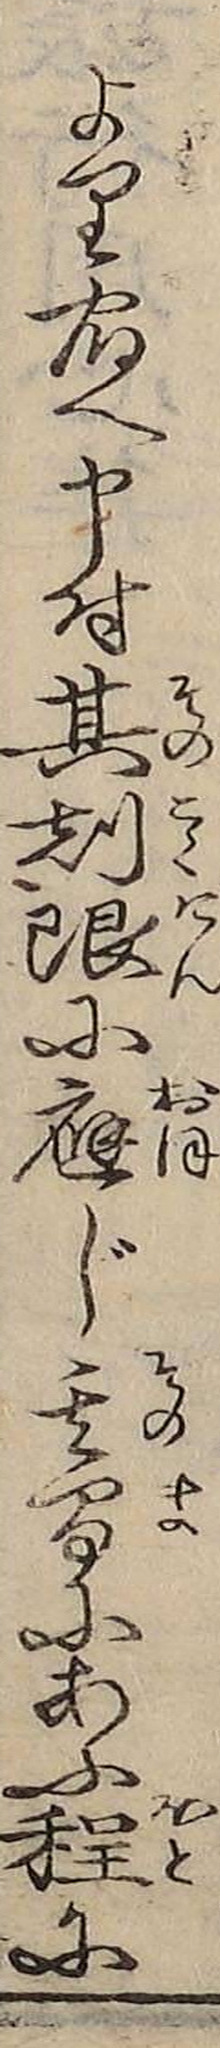より宿へ申付其刻限に応じ其間にあふ程に
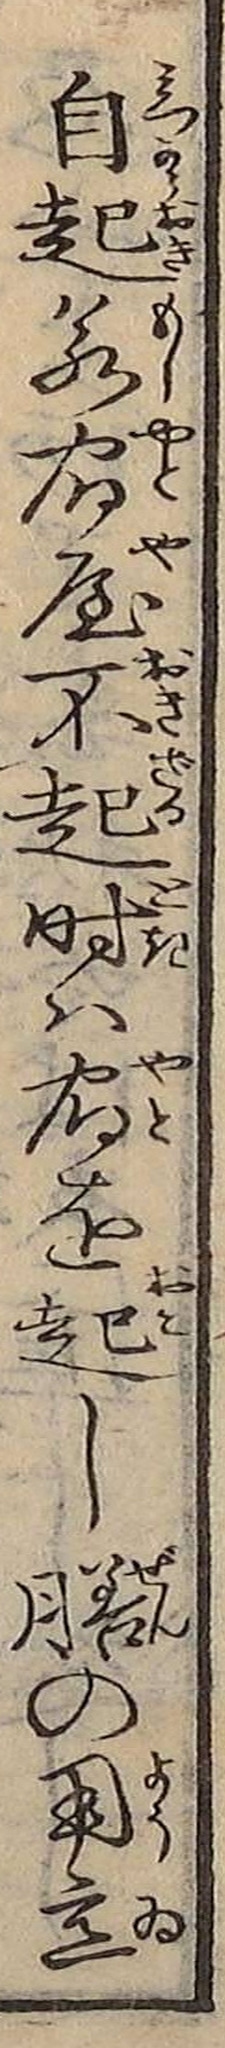自起若宿屋不起時は宿を起し膳の用意
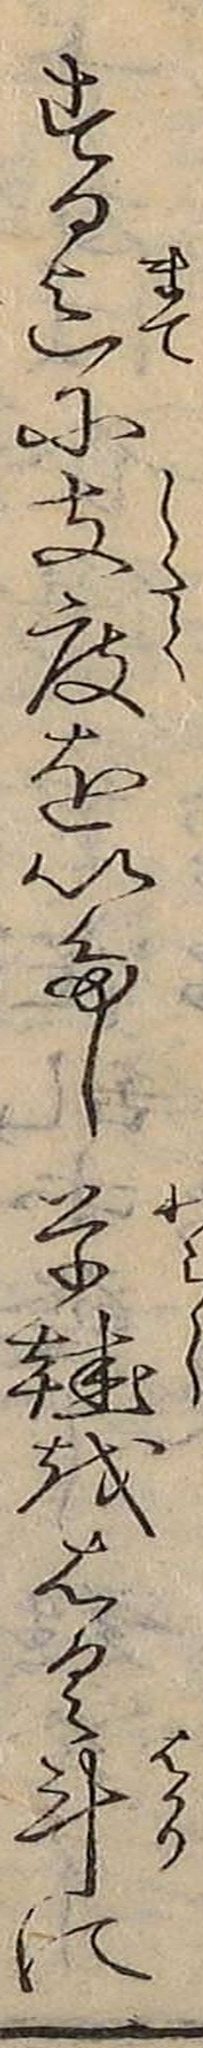する迄に支度をいたし草鞋をはく計に
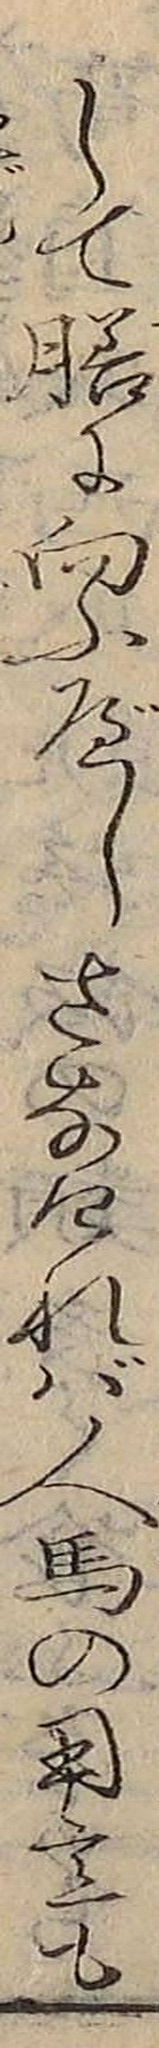して膳に向ふべしさなければ人馬の用意も
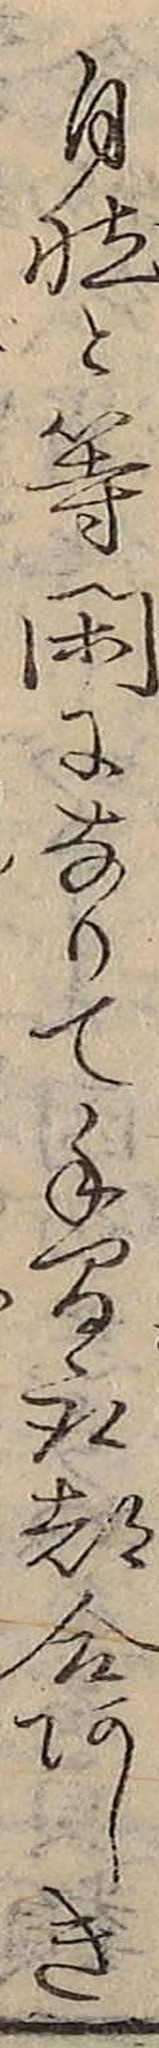自然と等閑になりて手間取都合あしき
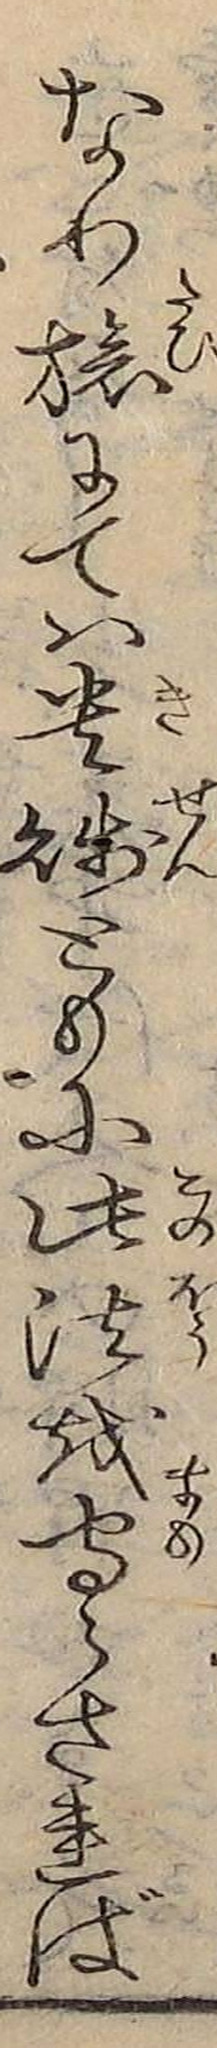なり旅にては貴賎ともに此法を守らされば
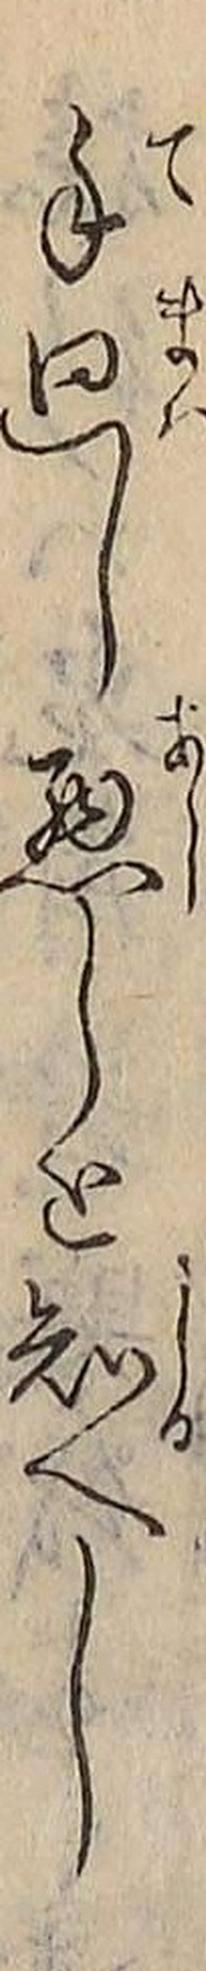手廻し悪しと知へし
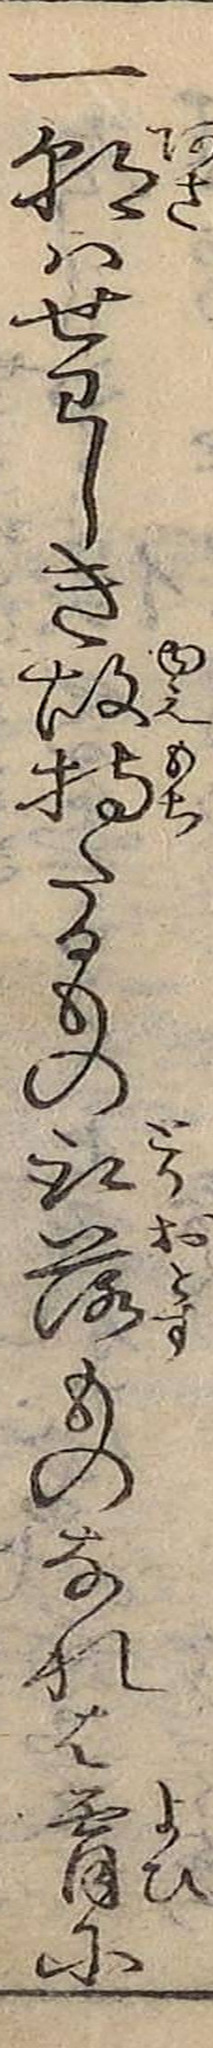一朝はせわしき故持たるもの取落ものなれは宵に
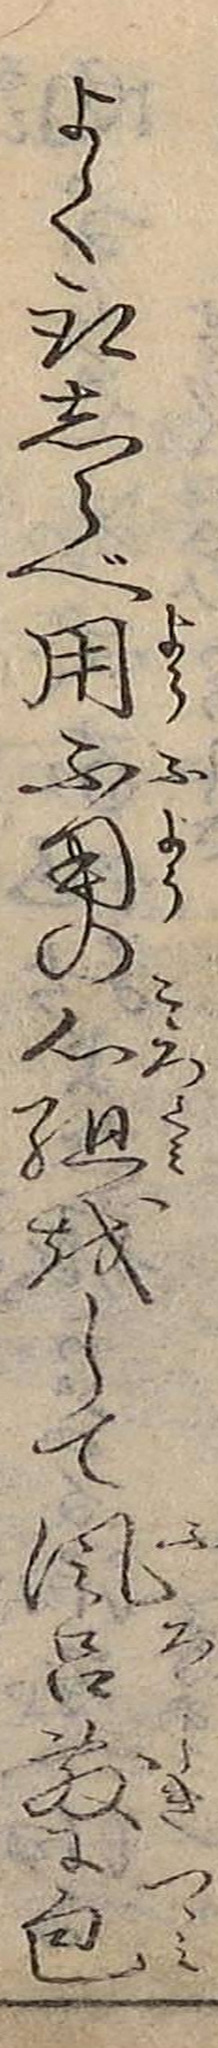よく取しらべ用不用の心組をして風呂敷に包
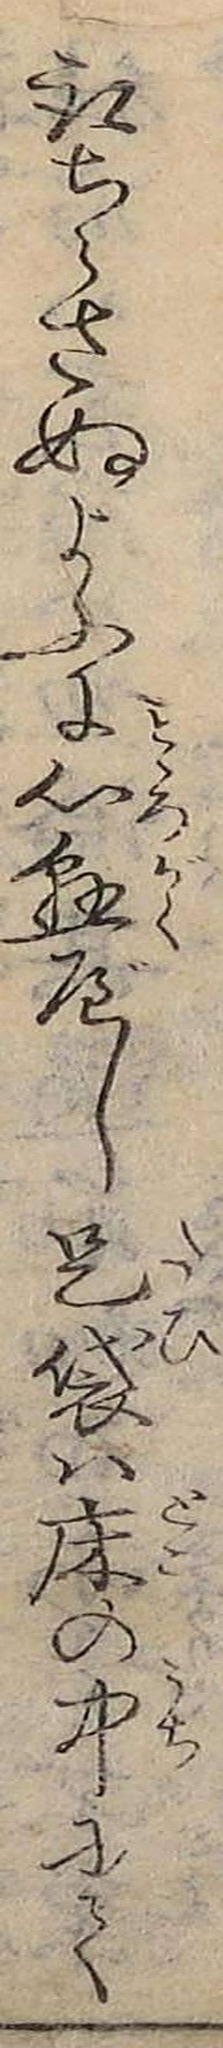取ちらさぬよふに心懸べし足袋は床の中にて
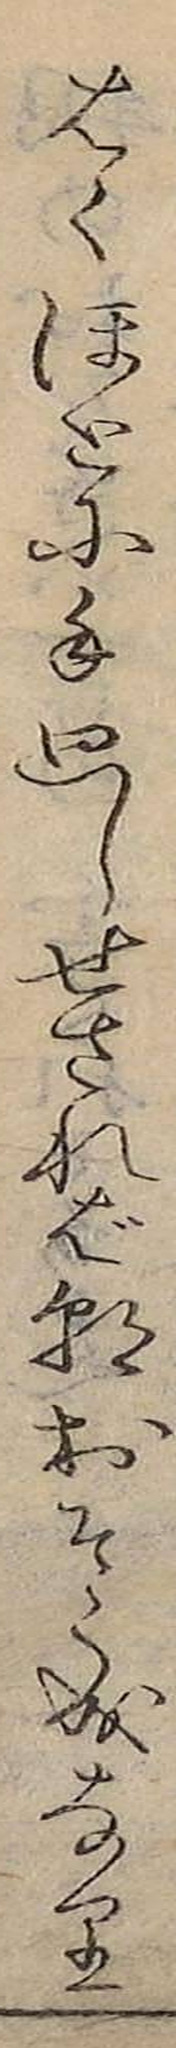はくほとに手廻しせされば朝おそく成なり

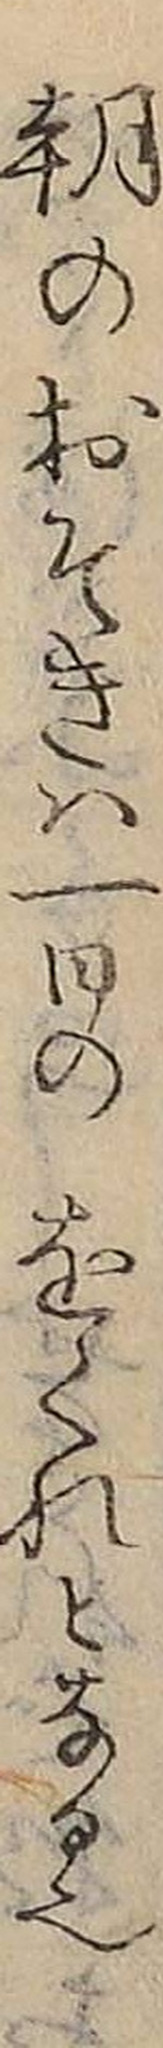朝のおそきは一日のをくれとなる也
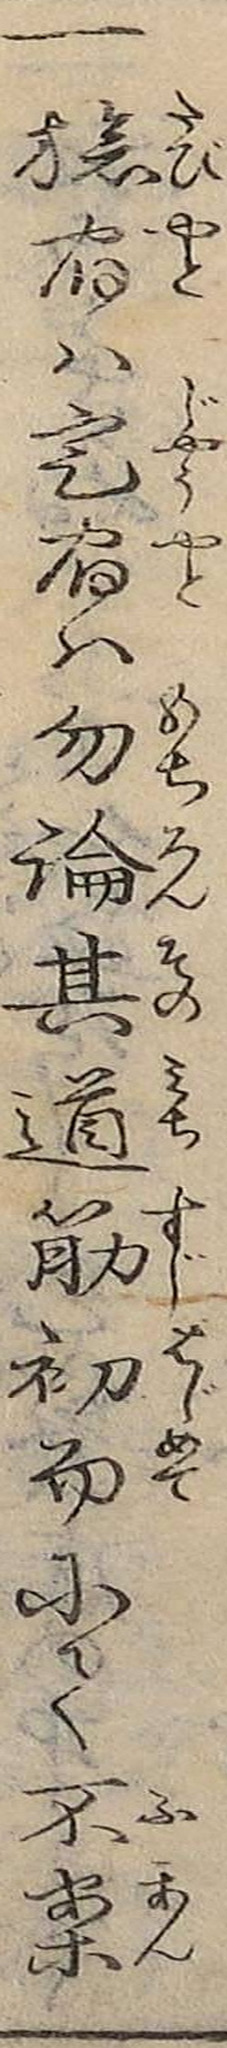一旅宿は定宿は勿論其道筋初而にて不案
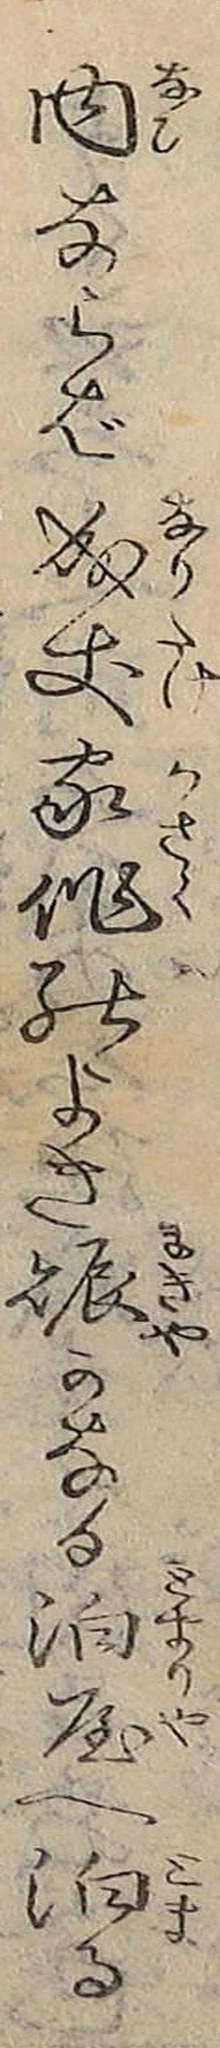内ならば成丈家作のよき賑かなる泊屋へ泊る
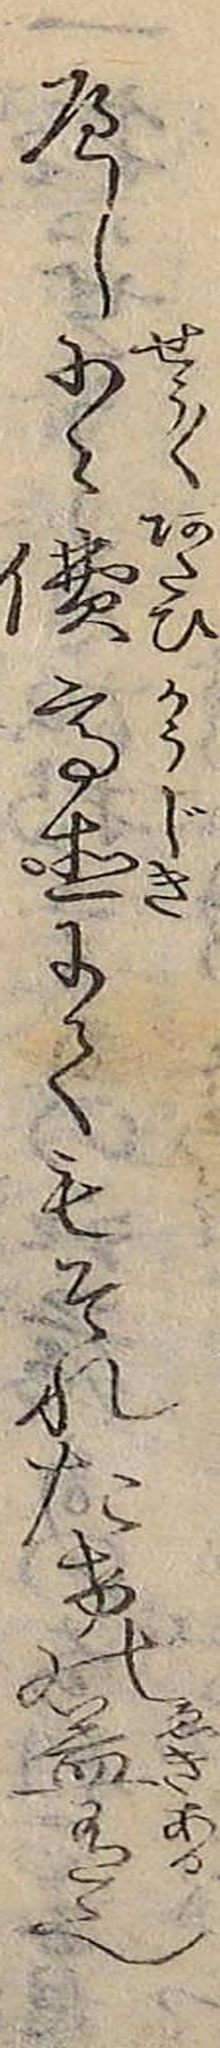へし少々価高直にてもそれたけの益有也
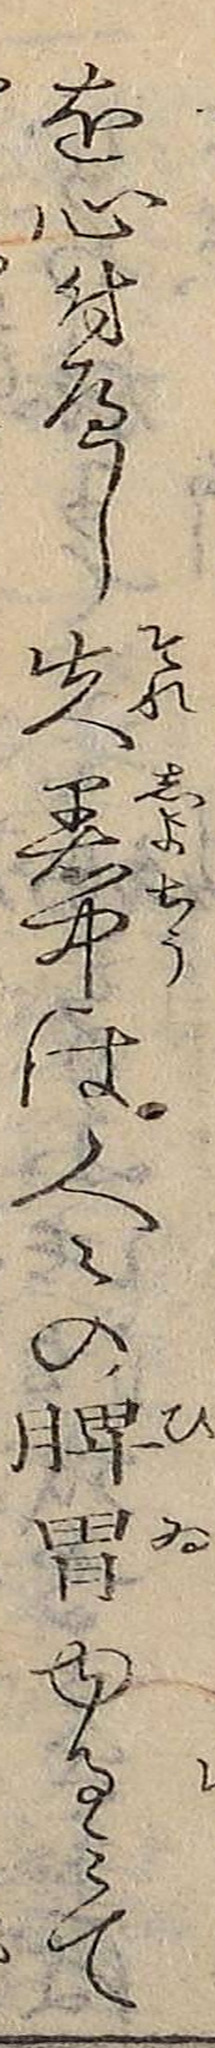を心付へし先暑中は人々の脾胃ゆるみて
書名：旅行用心集
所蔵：神戸大学附属図書館 国文学研究資料館
